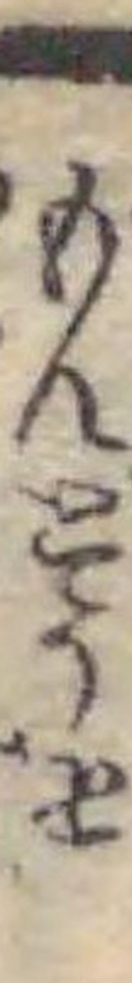もんどうを
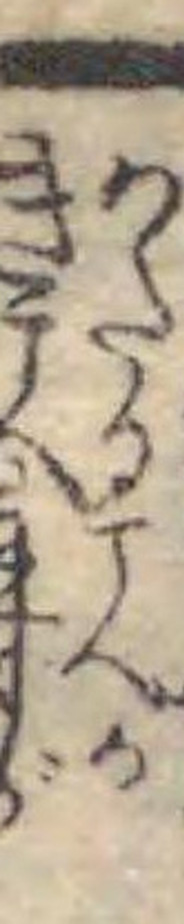かたるこへが
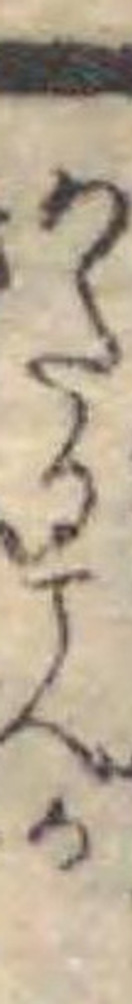かたるこへが
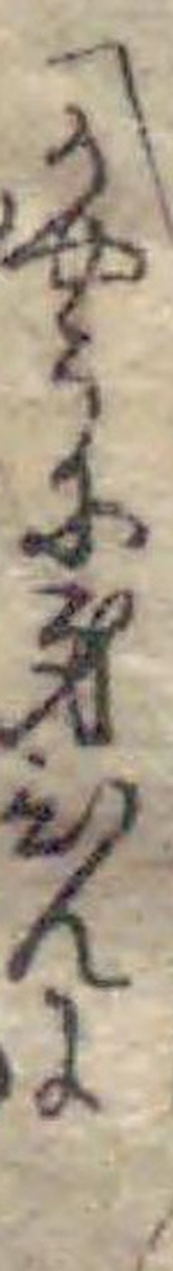〽かやうに身ひんに
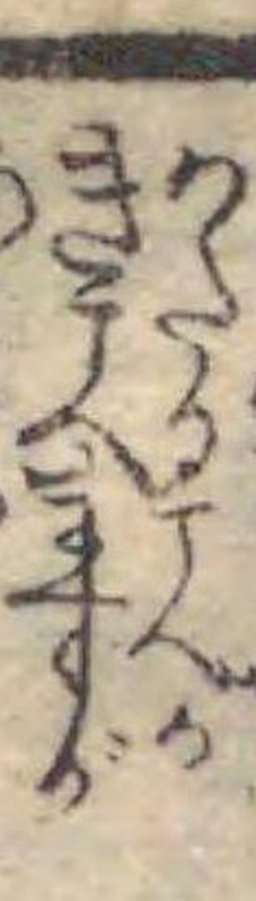きこへますが
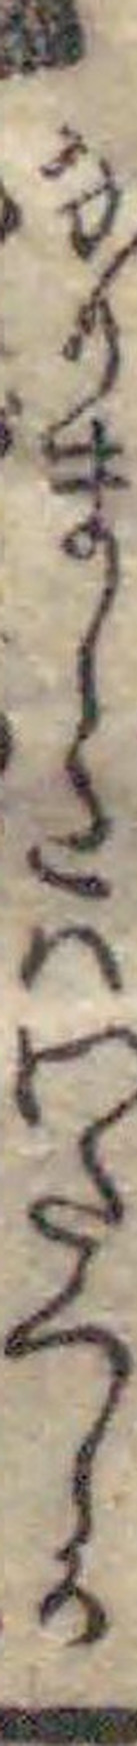なりましたはわたくしか
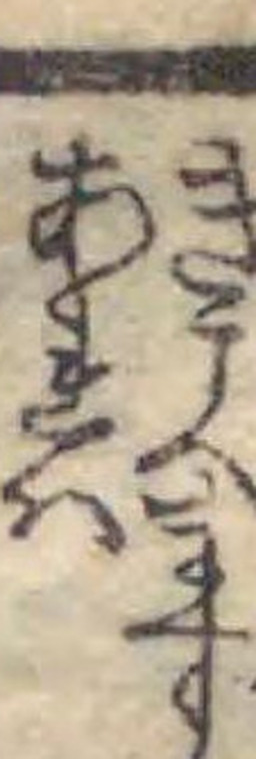あれは
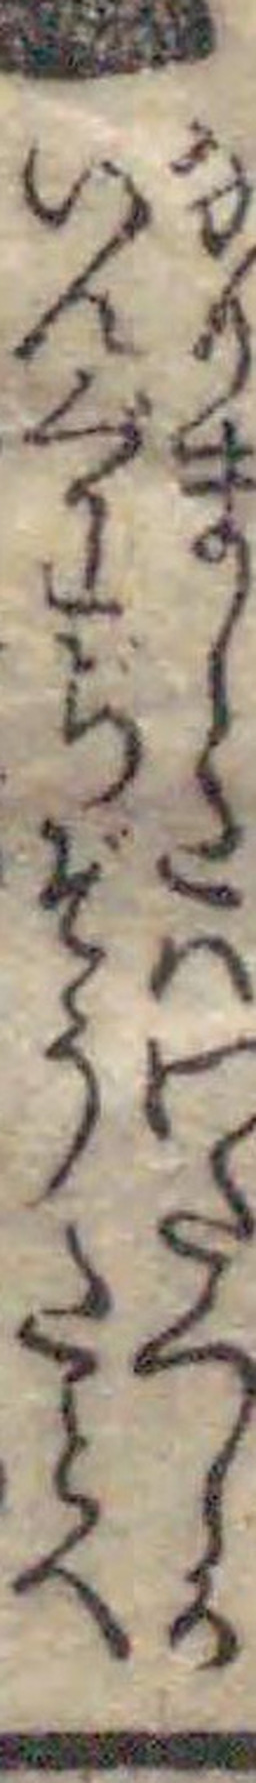いんぐわぢぞうたとへ
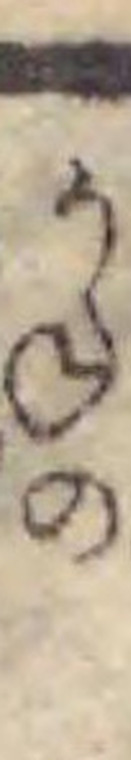かねの
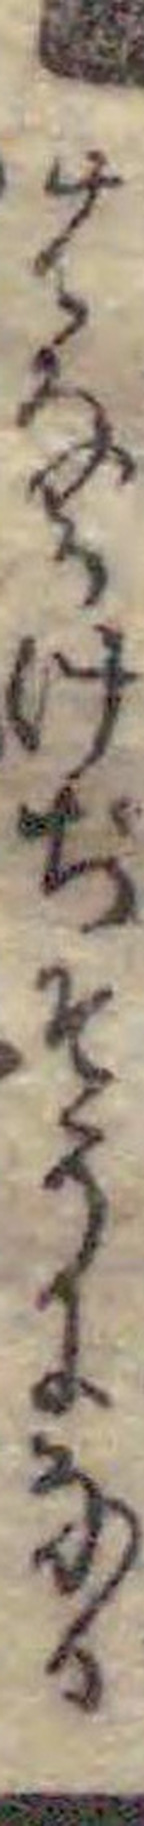はなかけぢそうになる
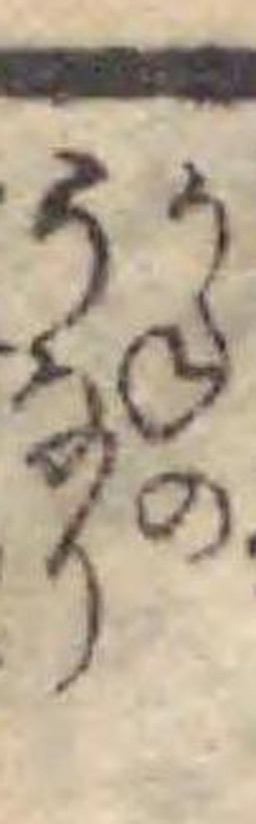うなり
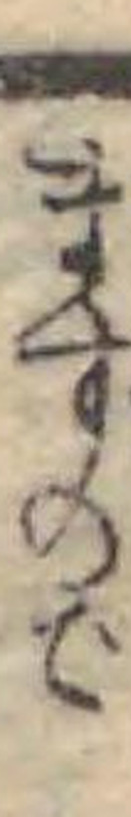ますので
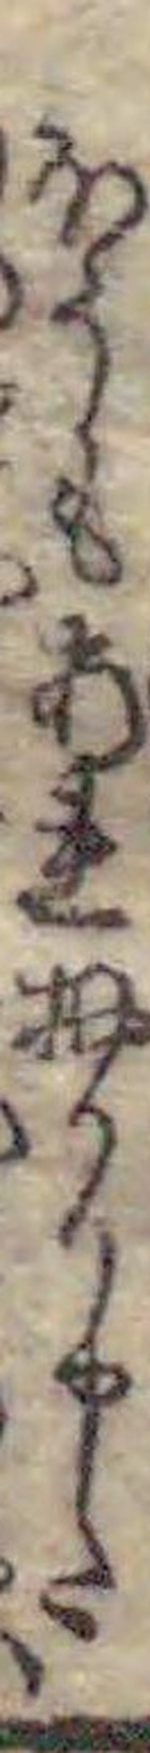ほうもあれおかり申た
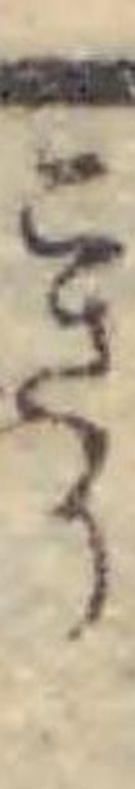こさり
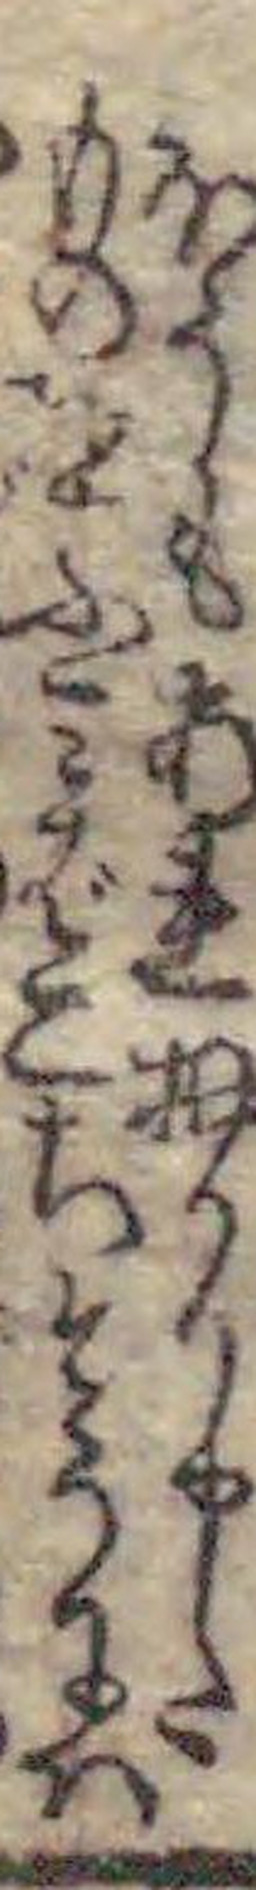ものをふみばこちそうには
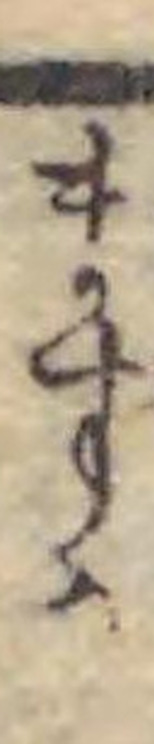ますか
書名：人心鏡写絵 : 3巻
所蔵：国立国会図書館 National Diet Library, JAPAN
